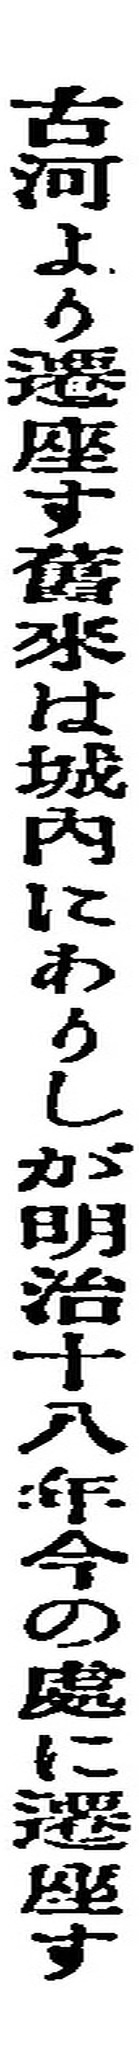古河より遷座す舊來は城内にありしが明治十八年今の處に遷座す
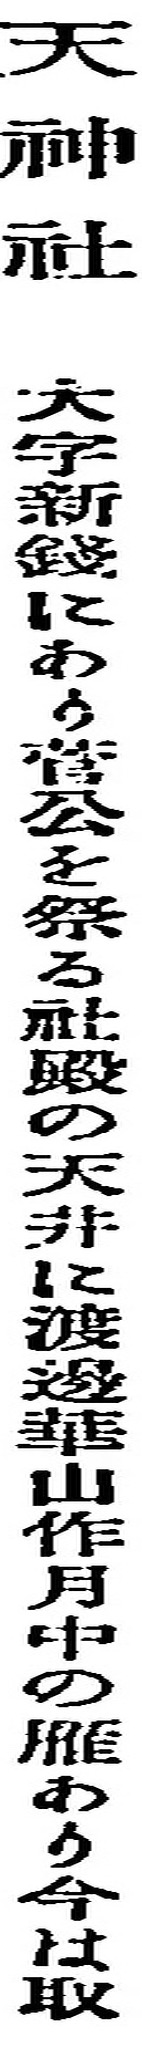天神社大字新錢にあり菅公を祭る社殿の天井に渡邊華山作月中の雁あり今は取
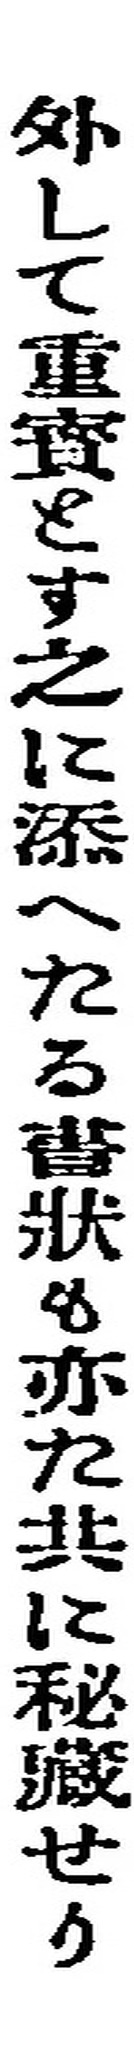外して重寶とす之に添へたる書狀も亦た共に秘藏せり
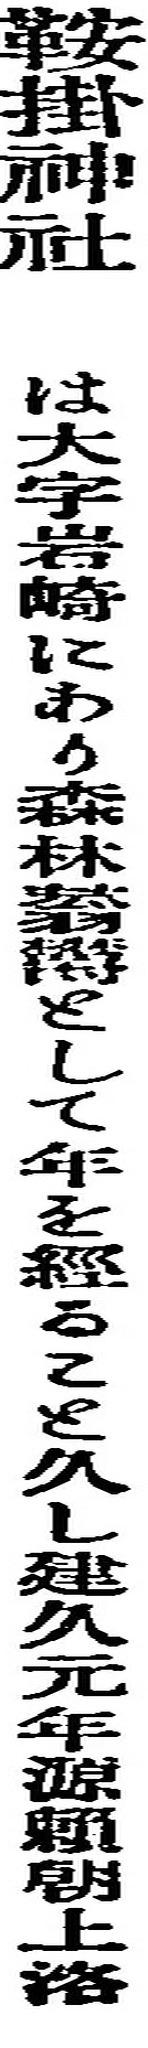鞍掛神社は大字岩崎にあり森林蓊鬱として年を經ること久し建久元年源賴朝上洛
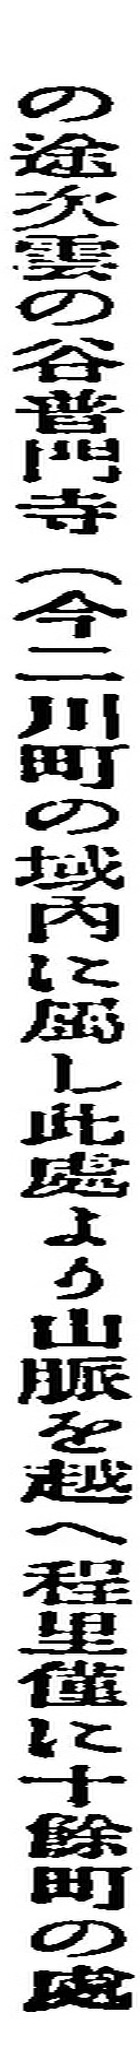の途次雲の谷普門寺(今二川町の域内に屬し此處より山脈を超へ程里僅に十餘町の處
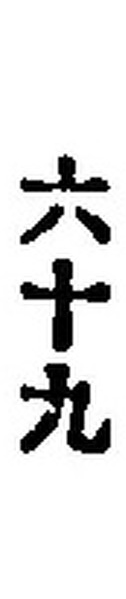六十九

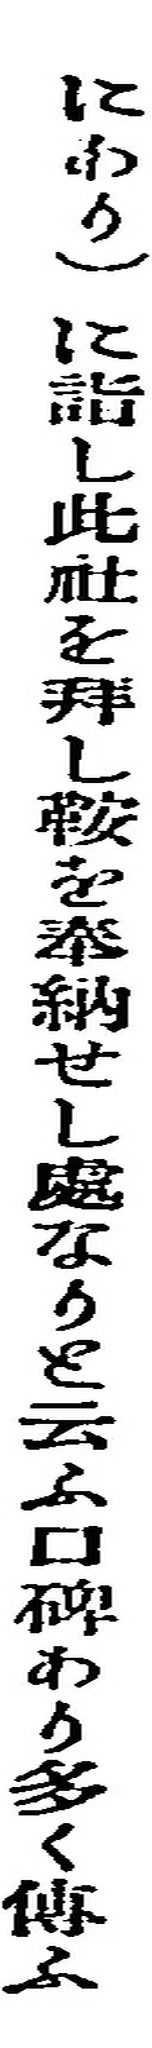にあり)に詣し此社を拜し鞍を奉納せし處なりと云ふ口碑あり多く傳ふ
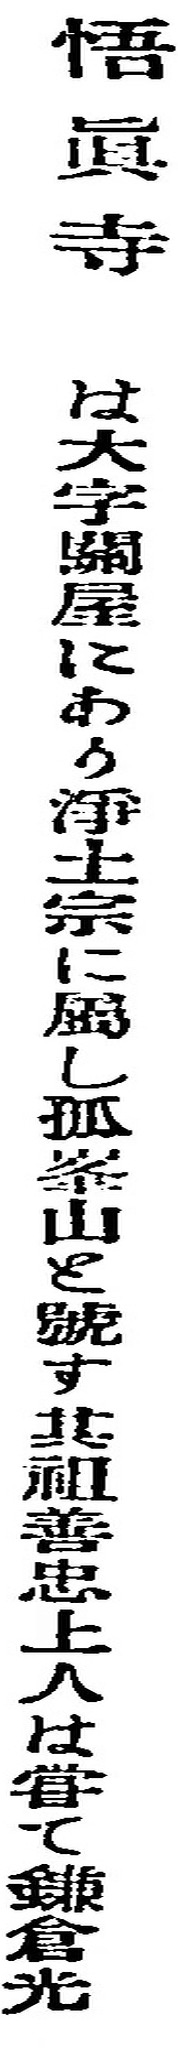悟眞寺は大字關屋にあり淨土宗に屬し弧峯山と號す其祖善忠上人は嘗て鎌倉光
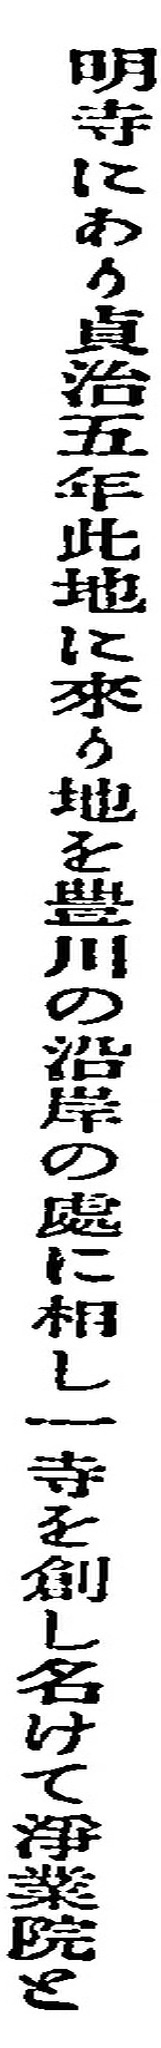明寺にあり貞治五年此地に來り地を豊川の沿岸の處に相し一寺を創し名けて淨業院と
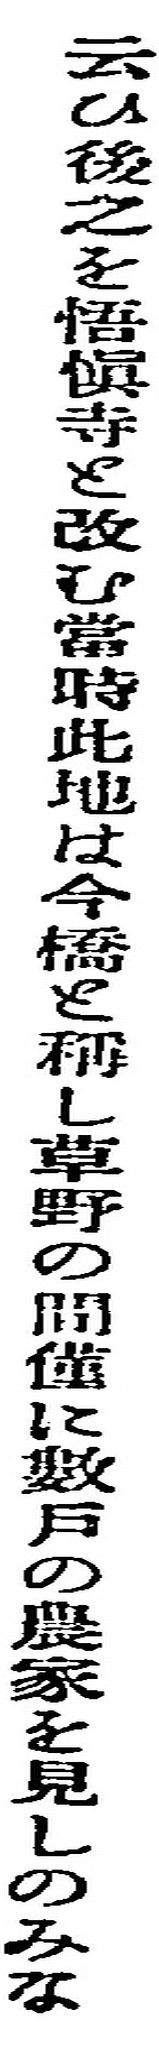云ひ後之を悟眞寺と改む當時此地は今橋と稱し草野の間僅に數戸の農家を見しのみな
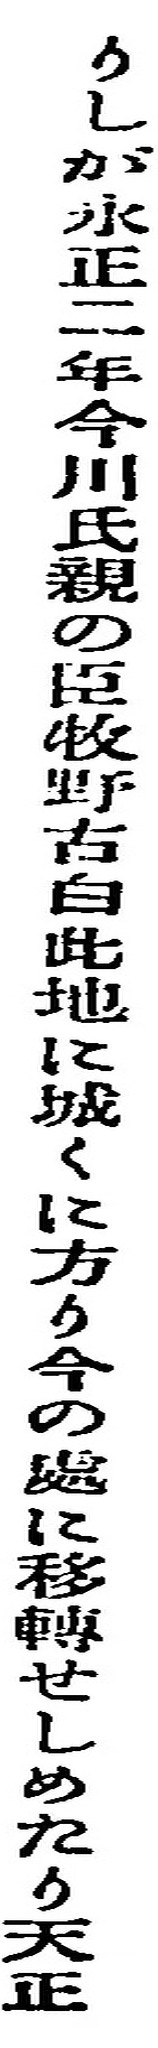りしが永正二年今川氏親の臣牧野古白此地に城くに方り今の處に移轉せしめたり天正
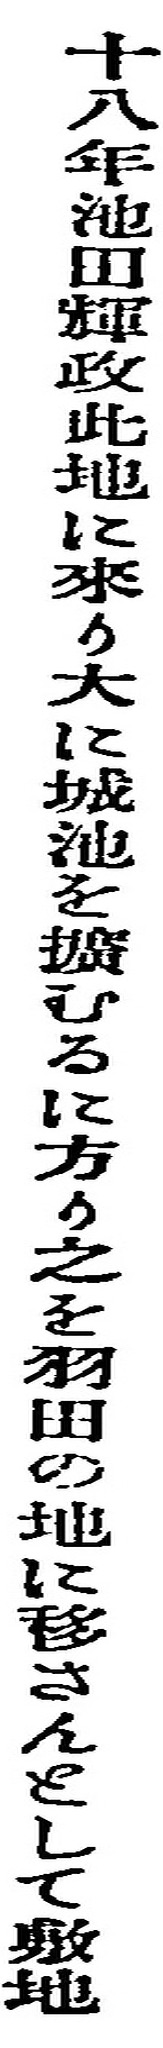十八年池田輝政此地に來り大に城池を擴むるに方り之を羽田の地に移さんとして敷地
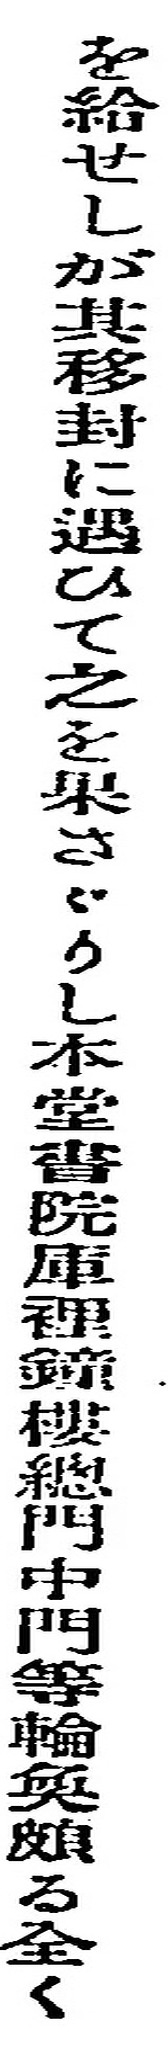を給せしが其移封に遇ひて之を果さゞりし本堂書院庫裡鐘樓總門中門等輪奐頗る全く
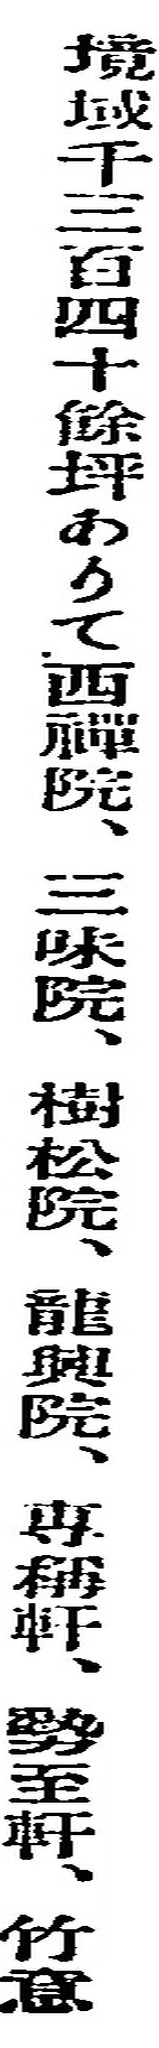境域千三百四十餘坪ありて西禪院、三昧院、樹松院、龍興院、專稱軒、勢至軒、竹意
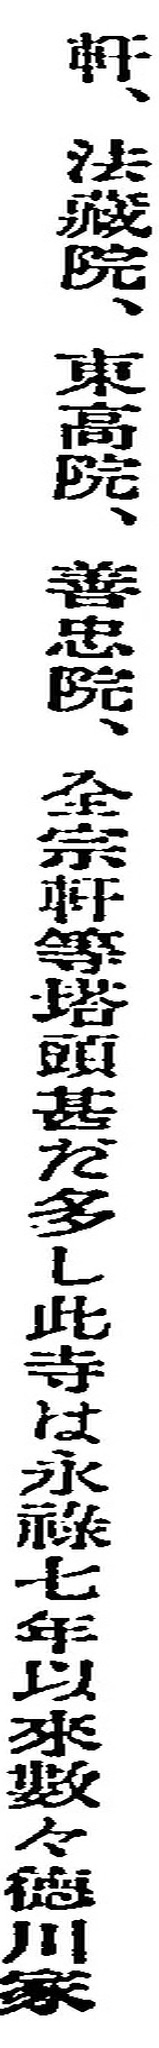軒、法藏院、東高院、善忠院、全宗軒等塔頭甚だ多し此寺は永祿七年以來數々德川家
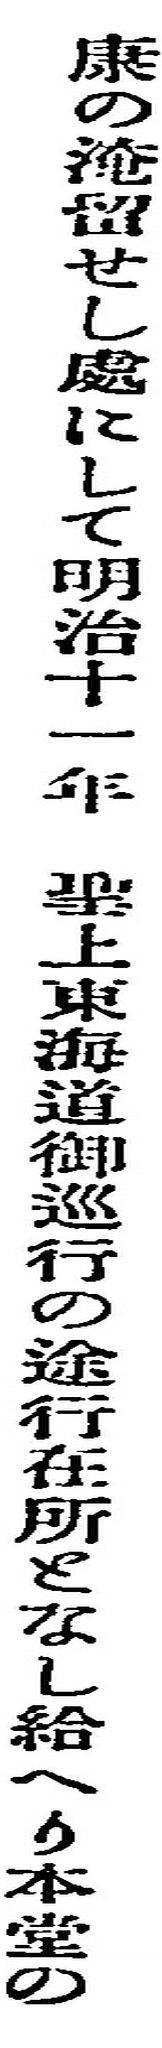康の淹留せし處にして明治十一年聖上東海道御巡行の途行在所となし給へり本堂の
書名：豊橋志要
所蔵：国立国会図書館 National Diet Library, JAPAN
